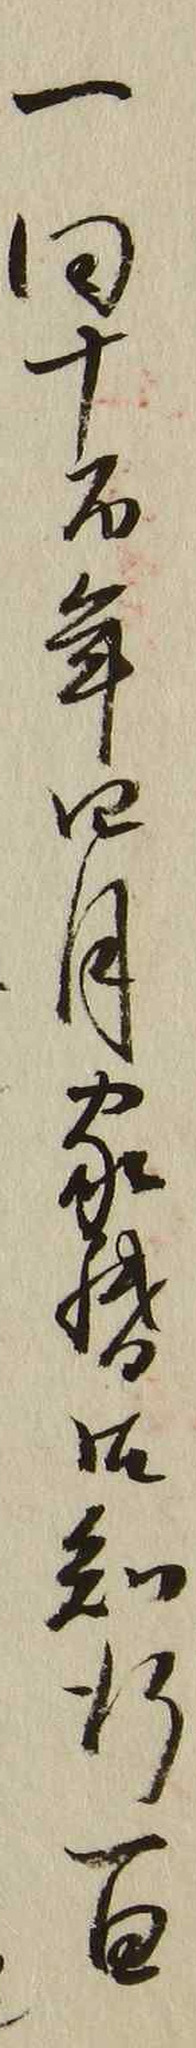一同十酉年四月家督御知行百
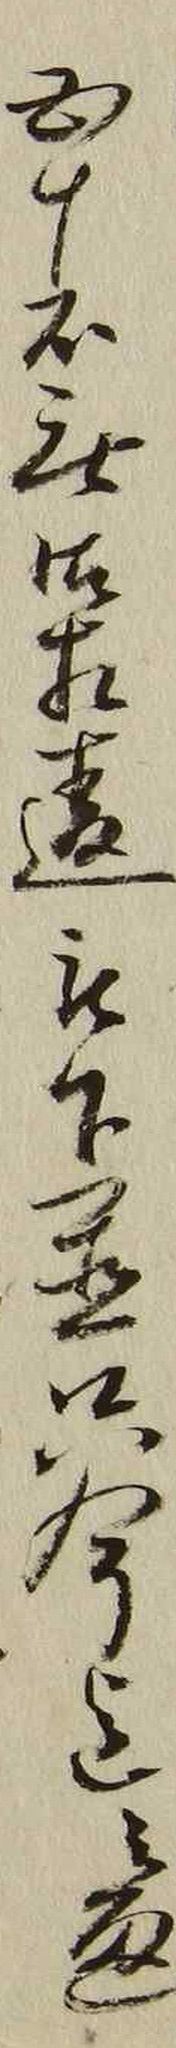五十石無御相違被下置只今迄之通
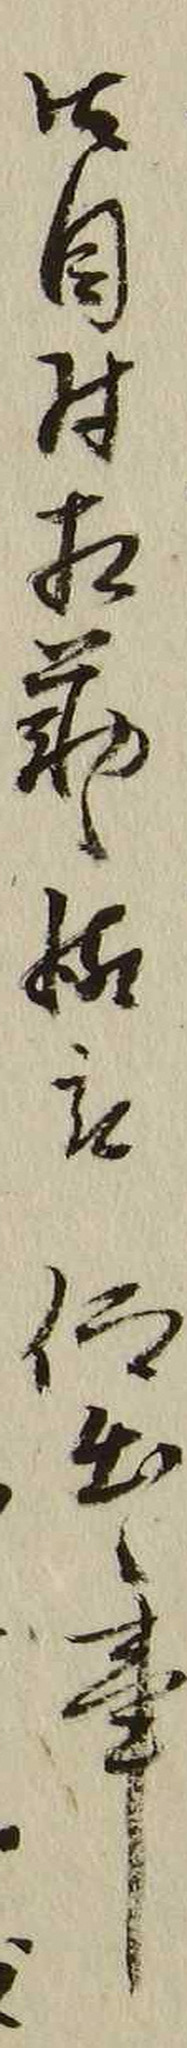御目付相勤候様被仰出候事
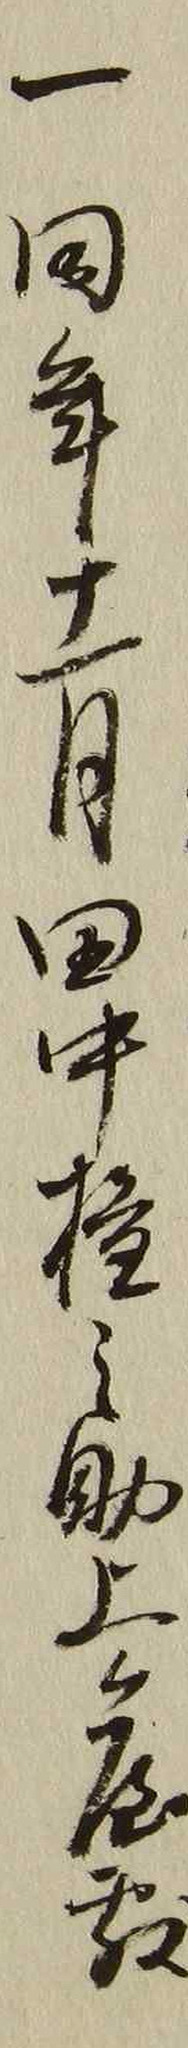一同年十一月田中権之助上ケ屋敷
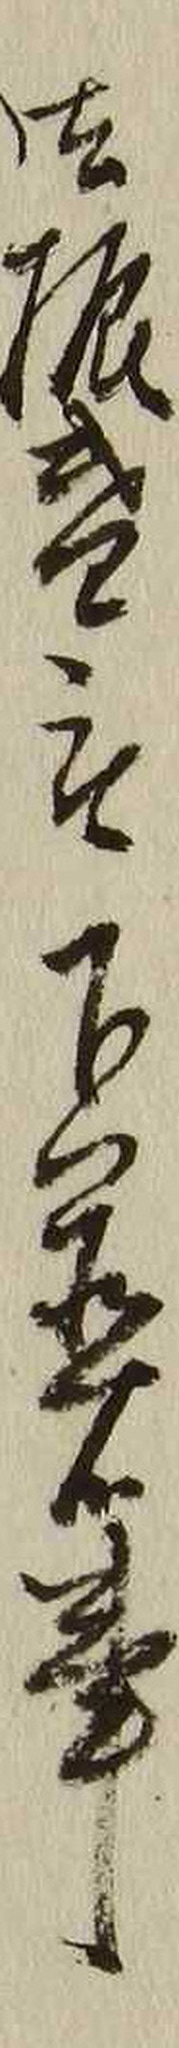御振替被下置候事
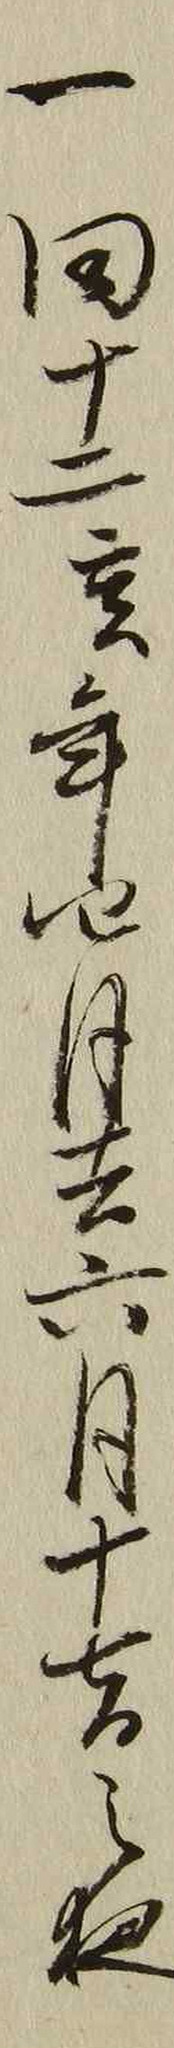一同十二亥年四月去六月十七日之夜
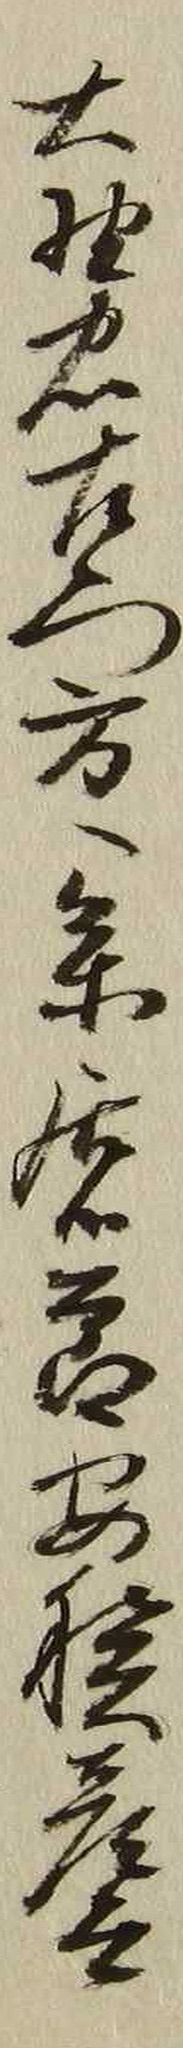大野忠左衛門方へ参居候節安積彦兵
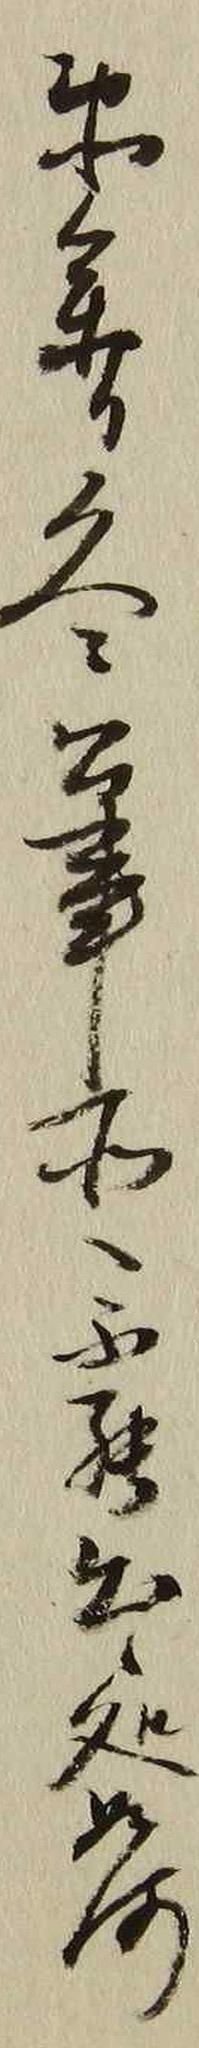衛参り久々公事所へ不罷出候処如何
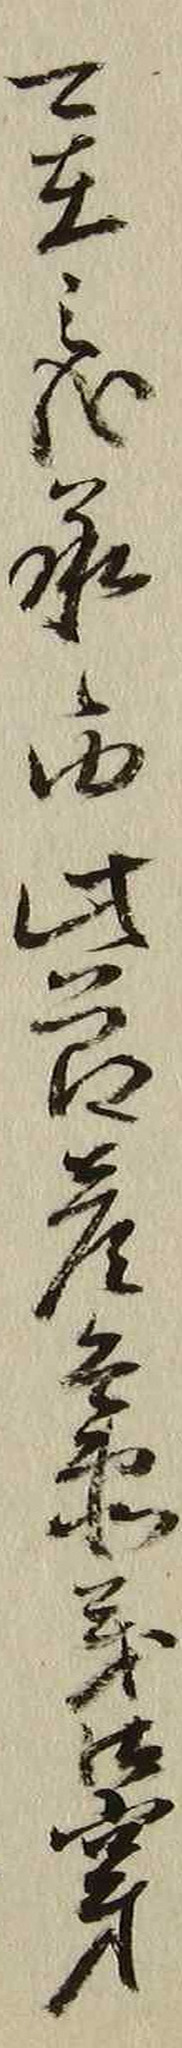可在之哉承候由此節彦兵衛義御穿
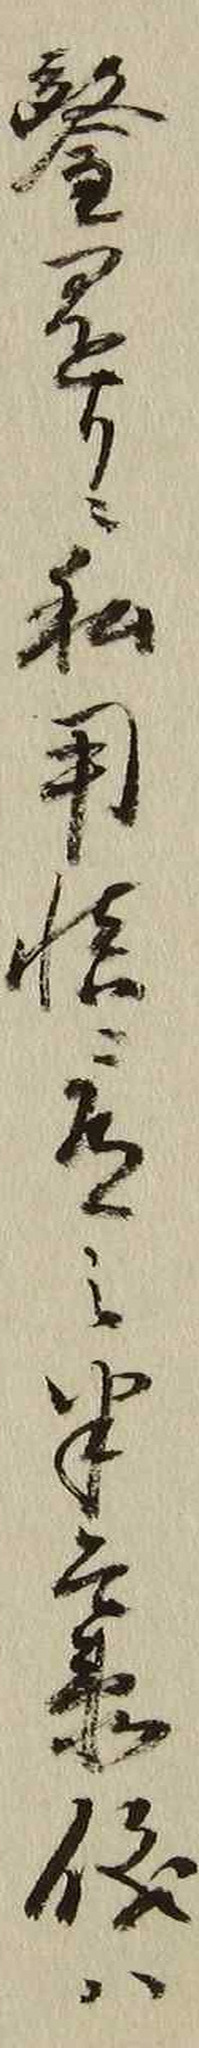鑿懸りニ私用慎ニ有之半兵衛儀ハ
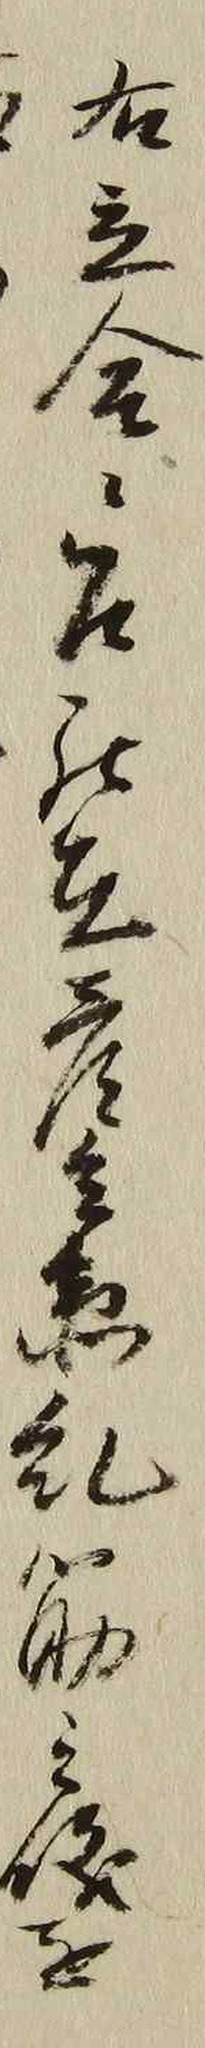右立合ニ乍罷在彦兵衛糺筋之儀を
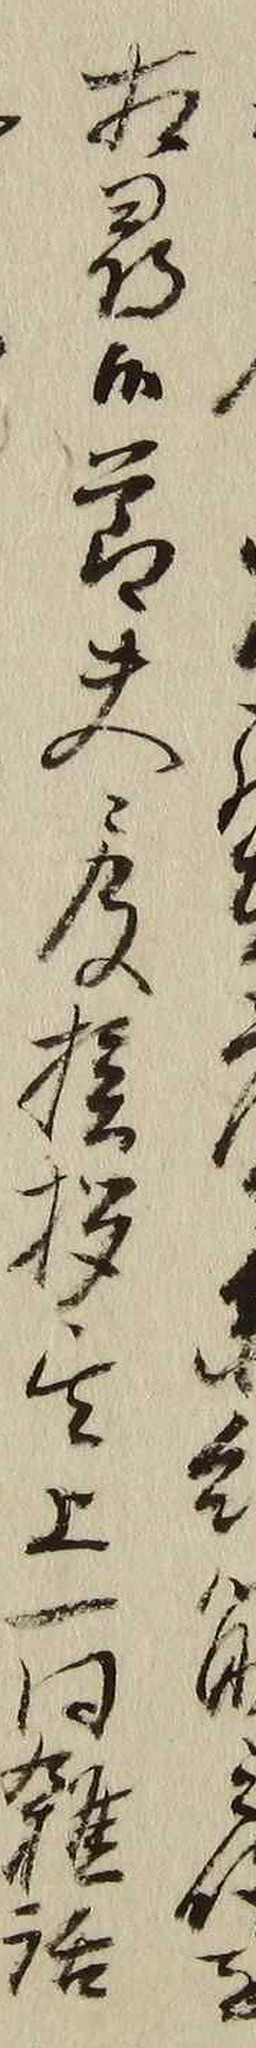相尋候節夫々及挨拶其上一同雑話
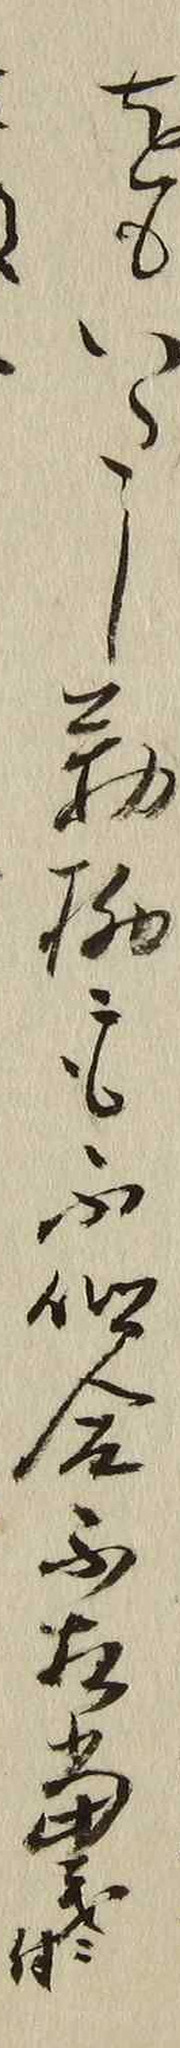をもいたし勤柄ニも不似合不相当義ニ付
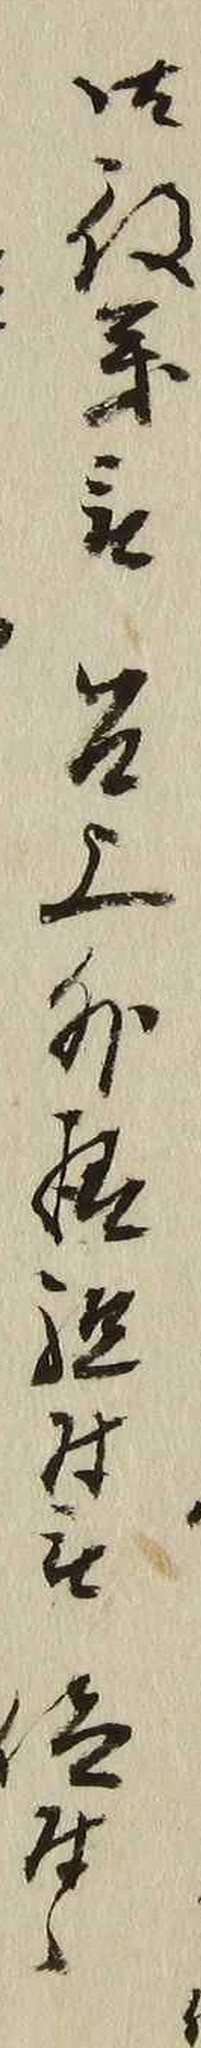御役義被召上外様組付被仰付候
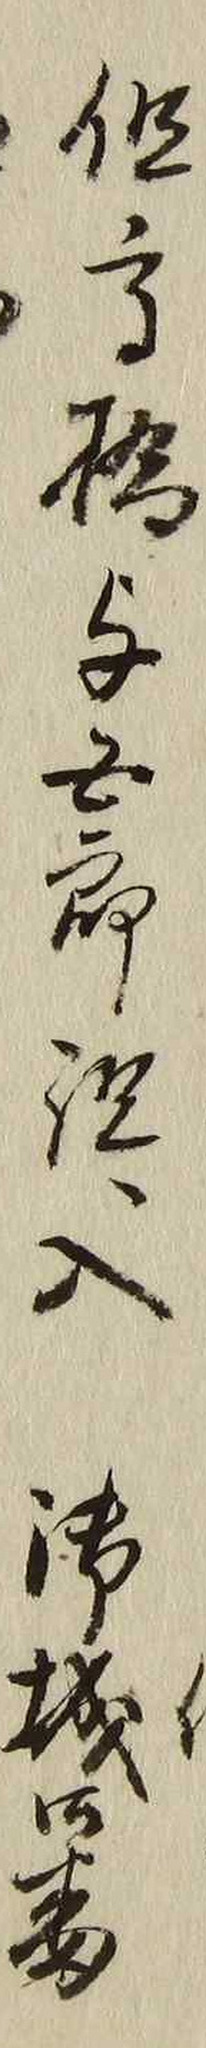但高橋与五郎組へ入御城御番
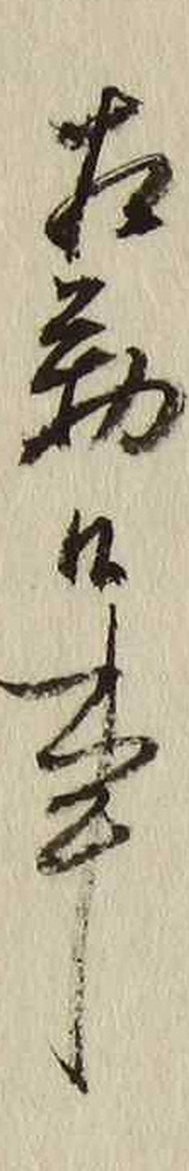相勤候事
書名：諸士系譜　巻之348　も之部4
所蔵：会津若松市立会津図書館
